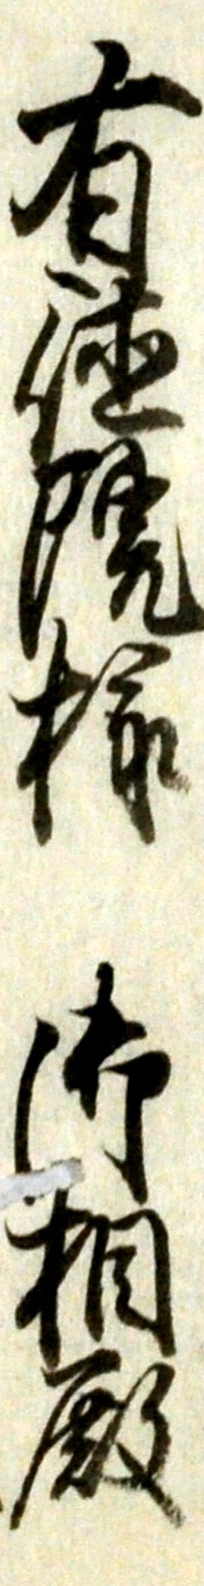有徳院様御相殿
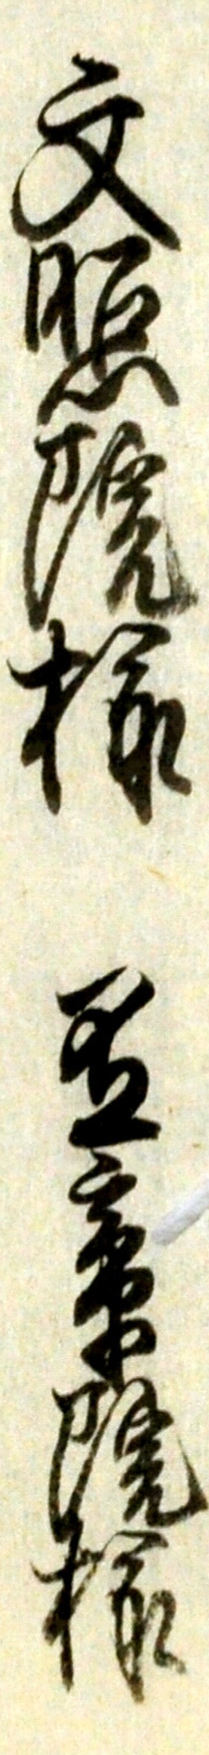文昭院様有章院様
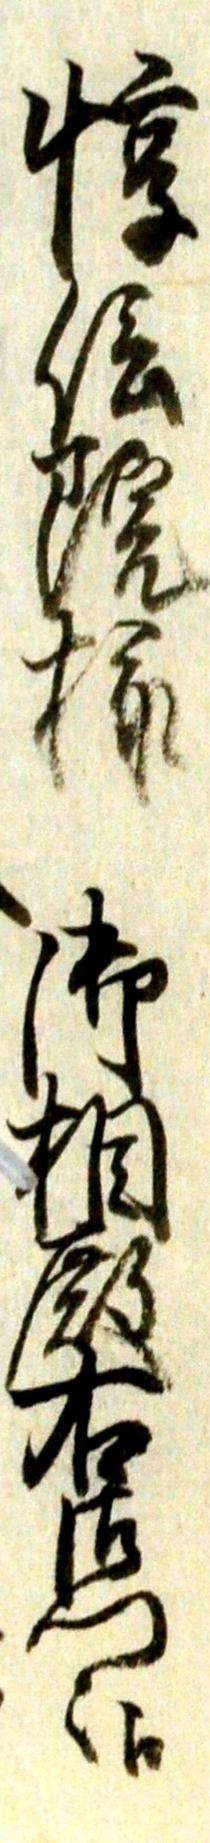惇信院様御相殿右御門々え
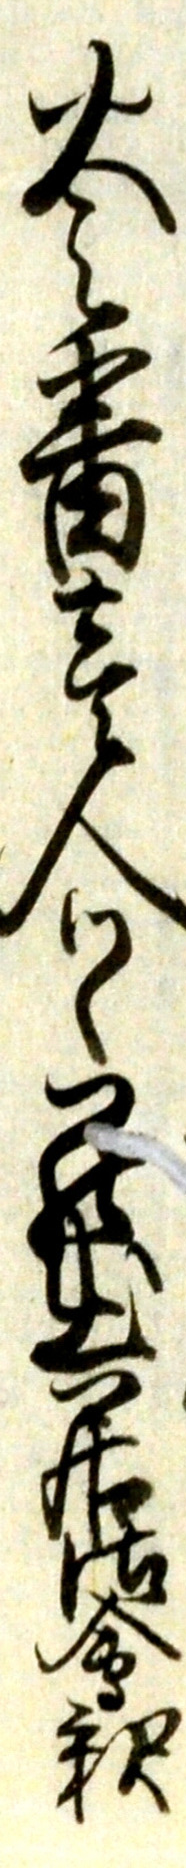火之番壱人ツヽ罷出居御会釈
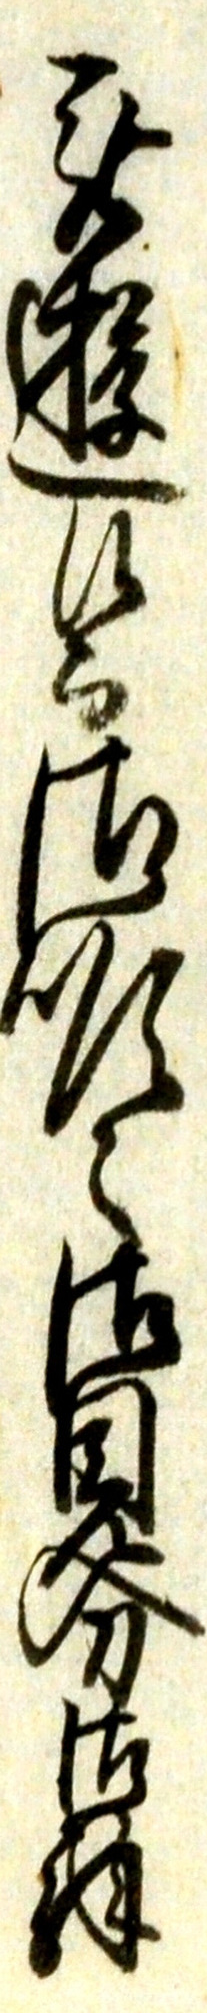被遊候而御順々御見分御拝
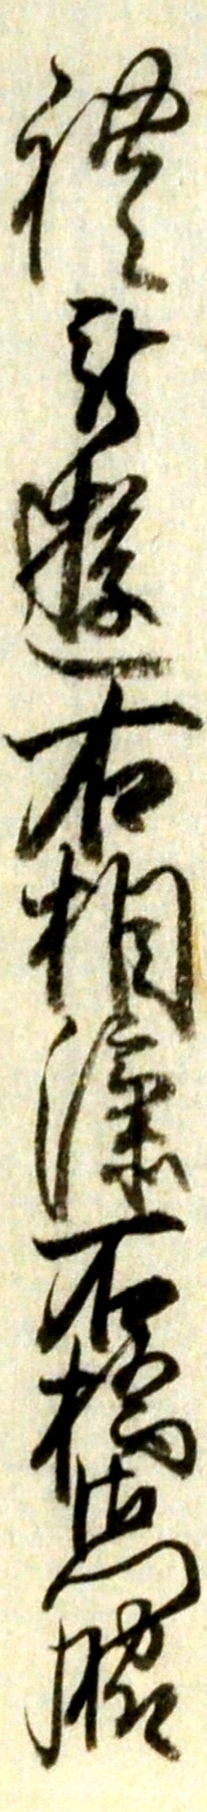礼被遊右相済石橋御門脇
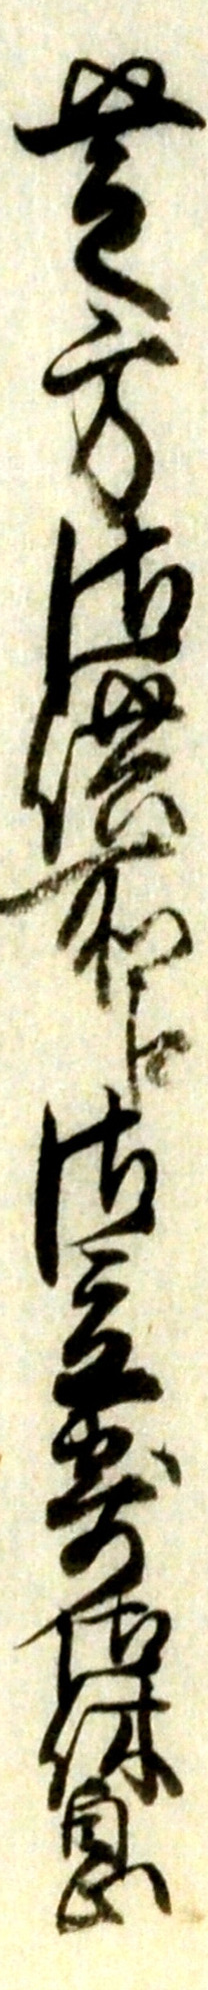芝方御供所え御立寄御休息
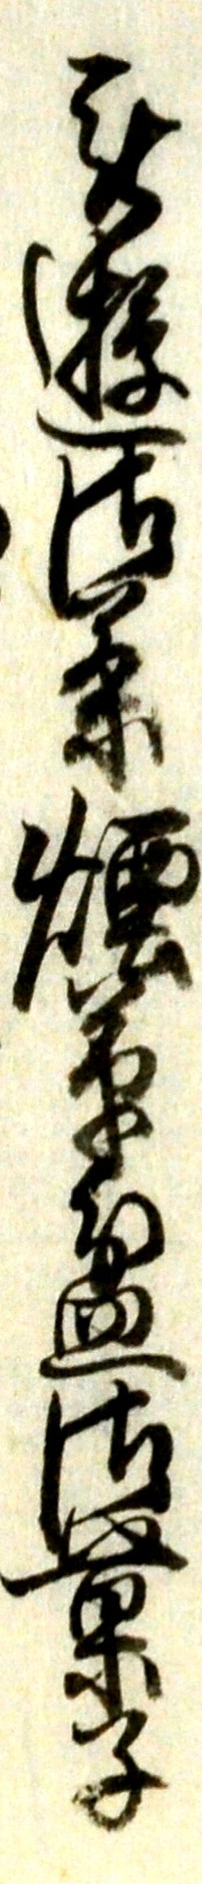被遊御茶煙草盆御菓子
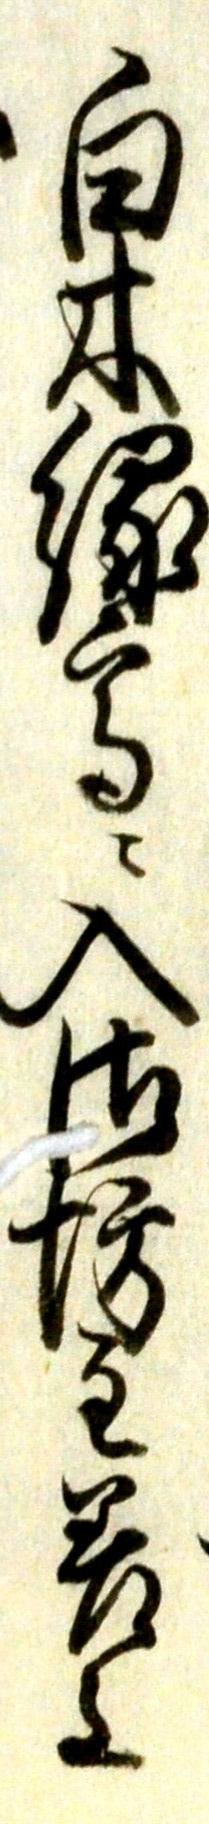白木縁高ニ入御坊主差上
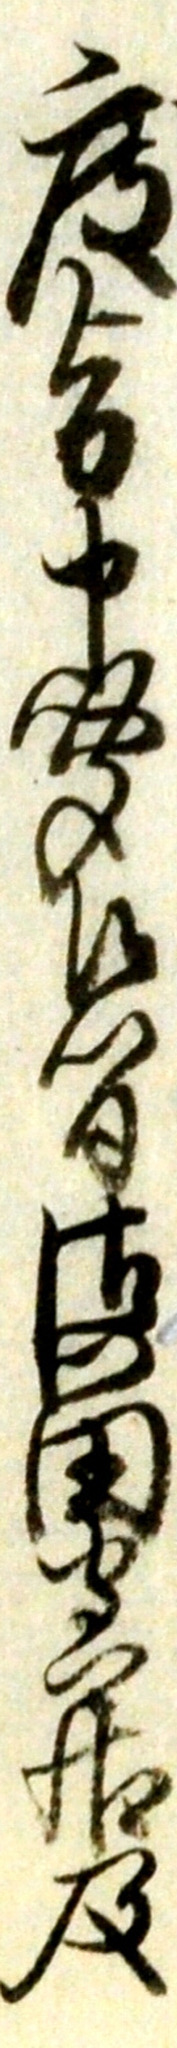度旨申聞候間御留守居及
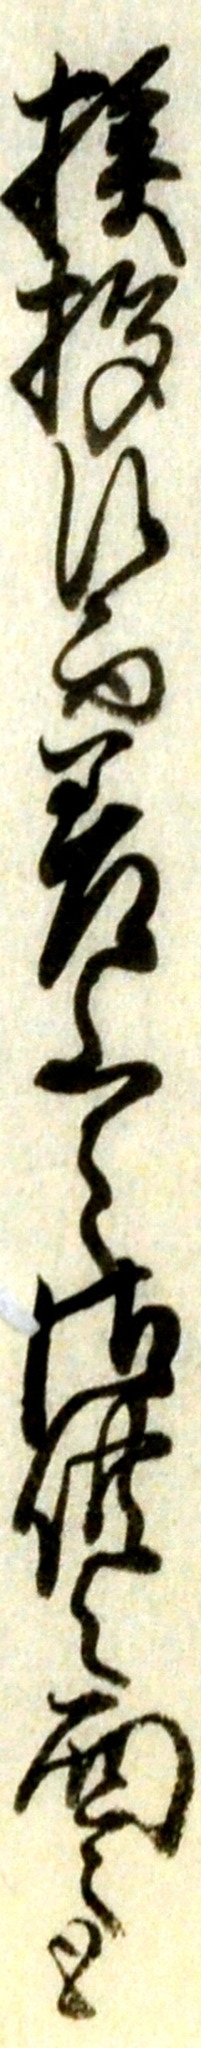挨拶候而差上候御供之面々も
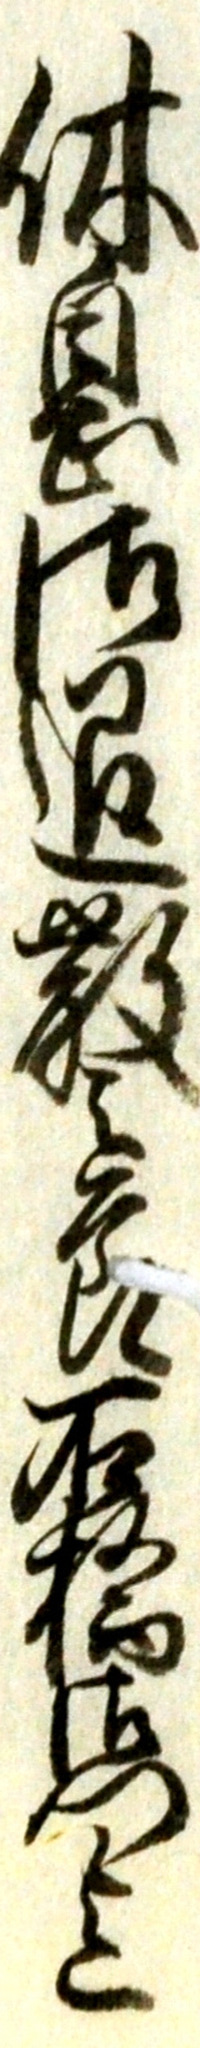休息御退散之節石橋御門迄
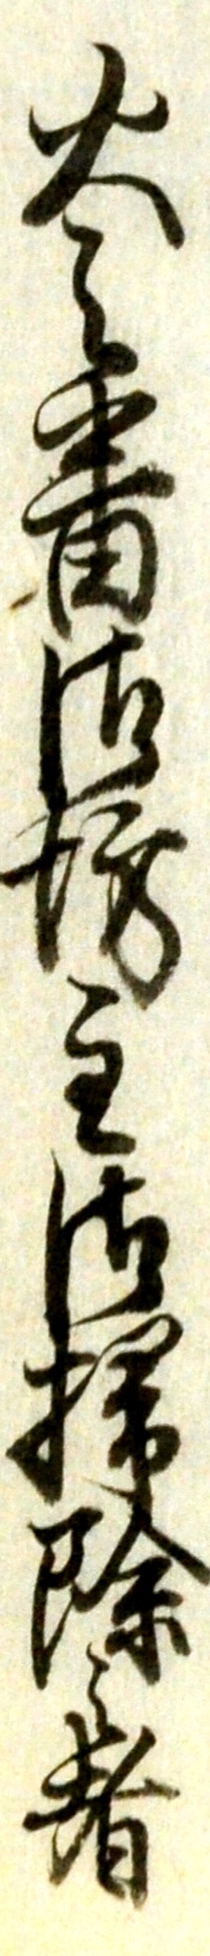火之番御坊主御掃除之者
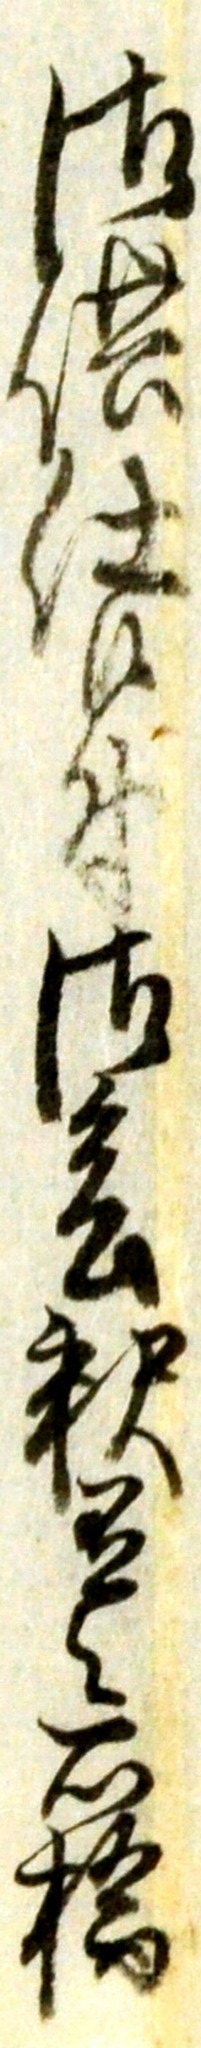御供仕候付御会釈有之石橋

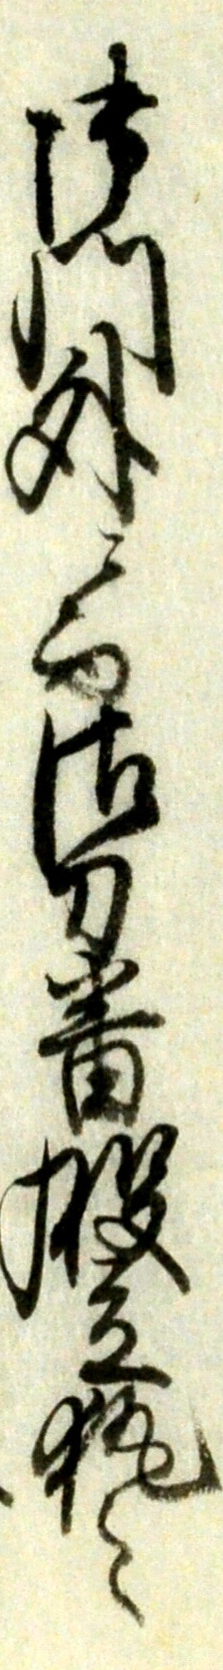御門外ニ而御刀番股立執之
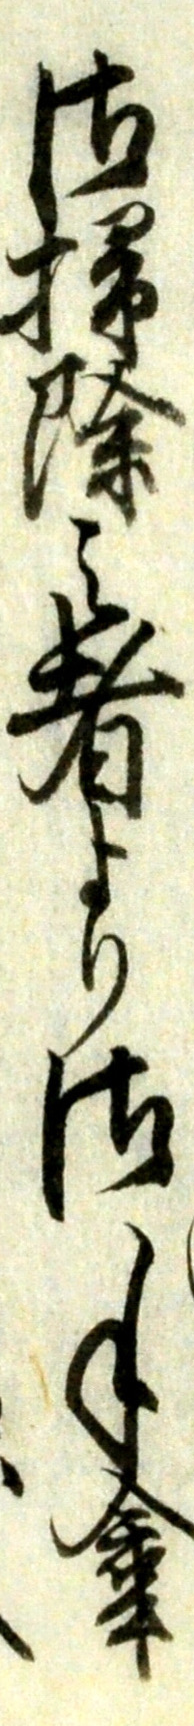御掃除之者より御手傘
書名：紅葉山御見分ノ節ノ御書付
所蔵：伊那市立高遠町図書館・合同会社AMANE
